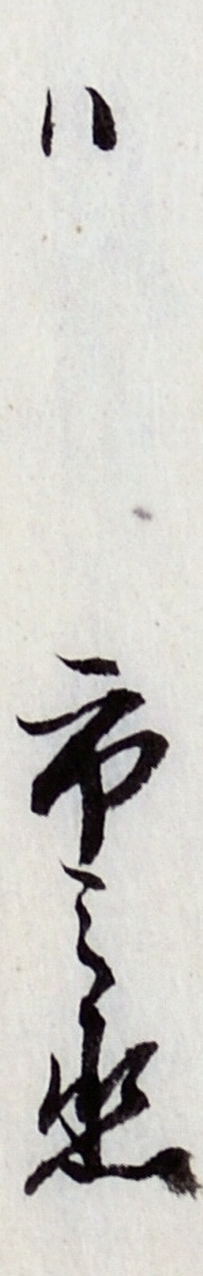同市之丞
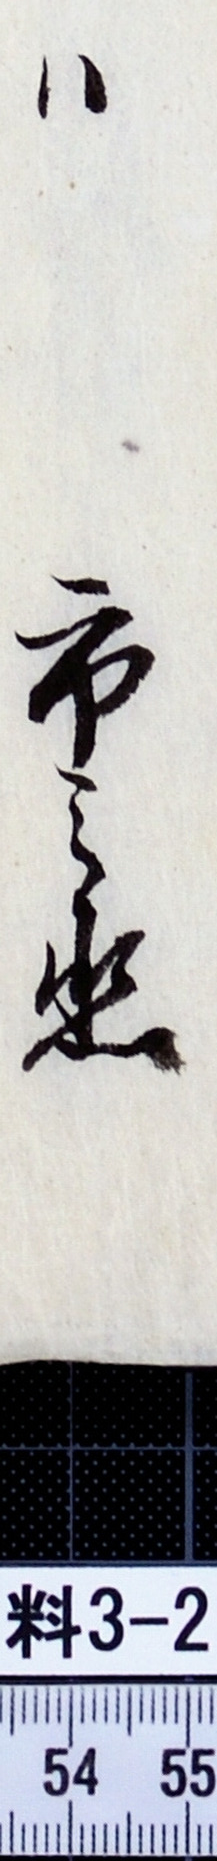同市之丞
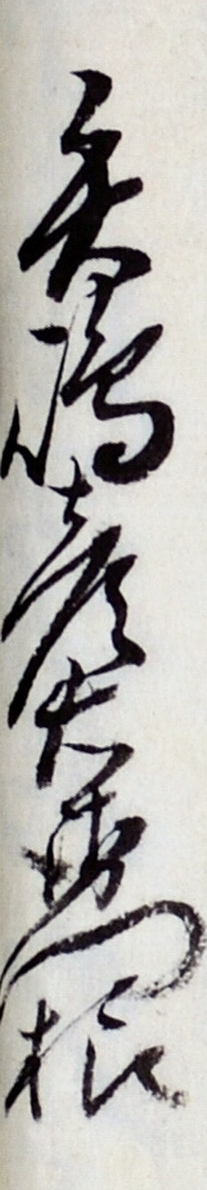矢嶋彦右衛門様
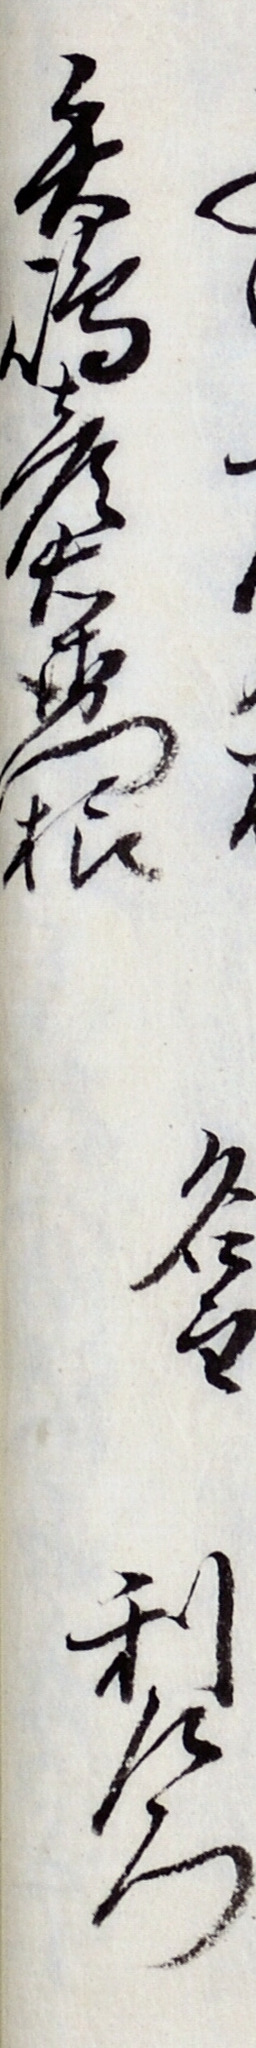矢嶋彦右衛門様
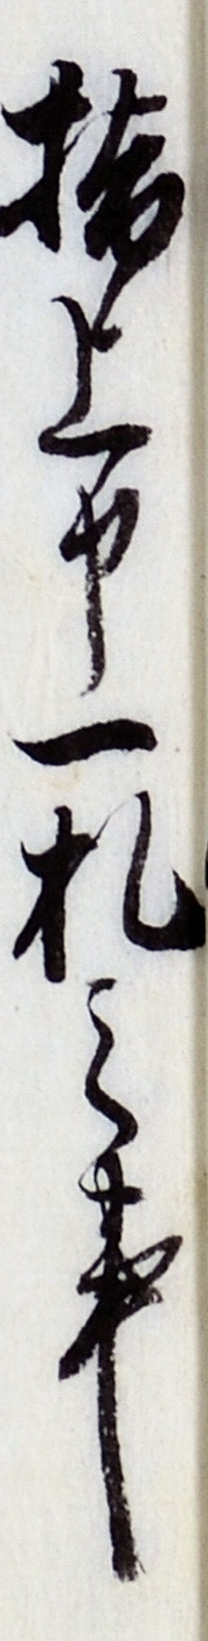指上申一札之事
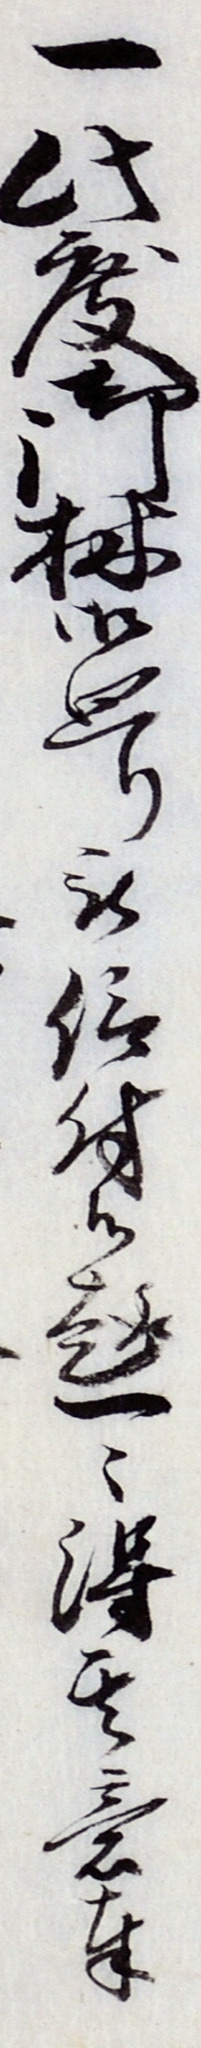一此度御林御廻り被仰付候趣一々得其意奉
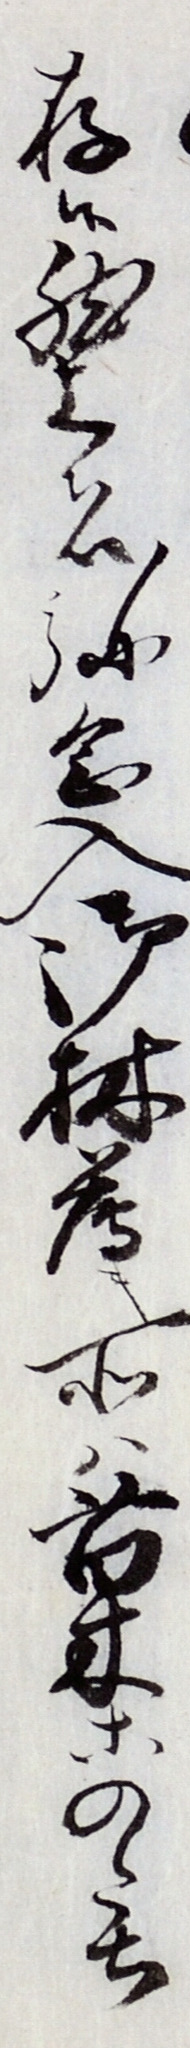存候然上は弥念入御林薄キ所ハ苗木等のたち
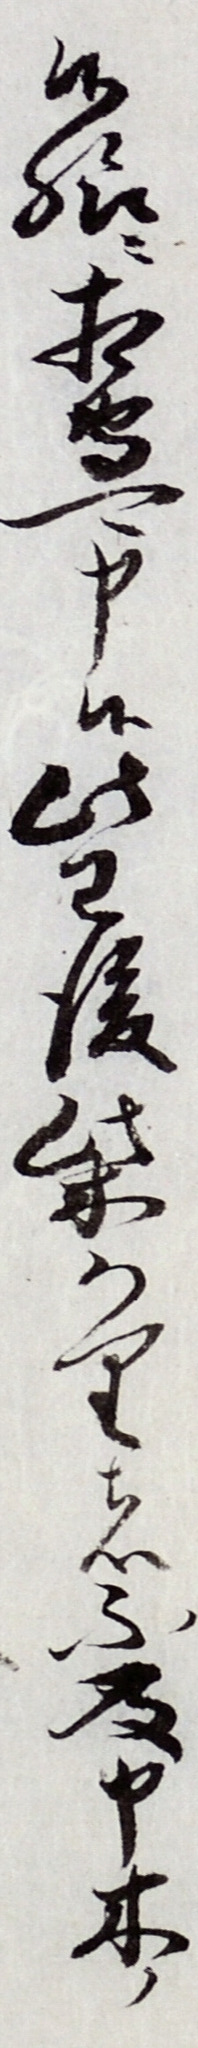候様ニ相守可申候此已後柴かりは不及申木ノ
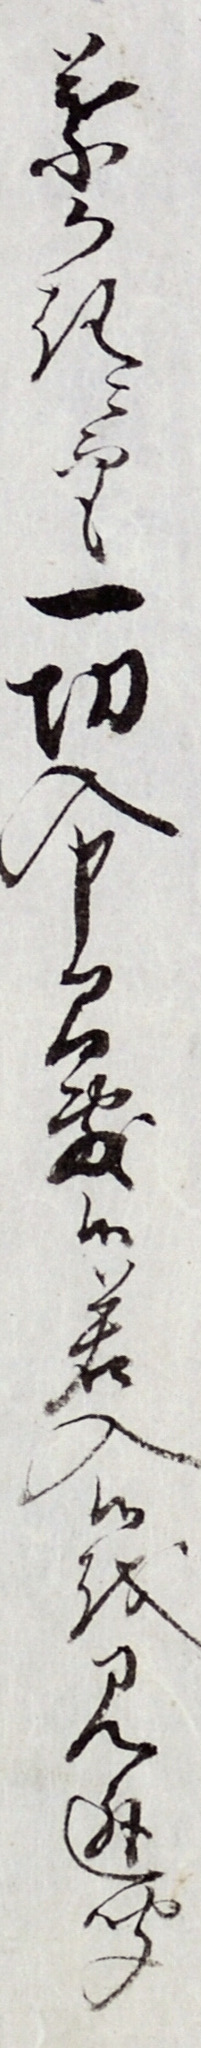葉かきニ而も一切入申間敷候若入候を見逃聞
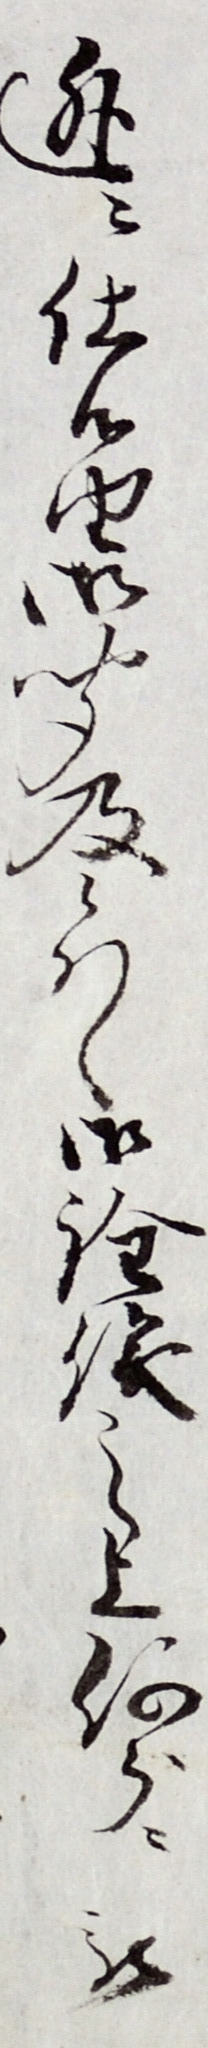逃ニ仕候由御聞及候ハヽ御詮儀之上何分ニ被
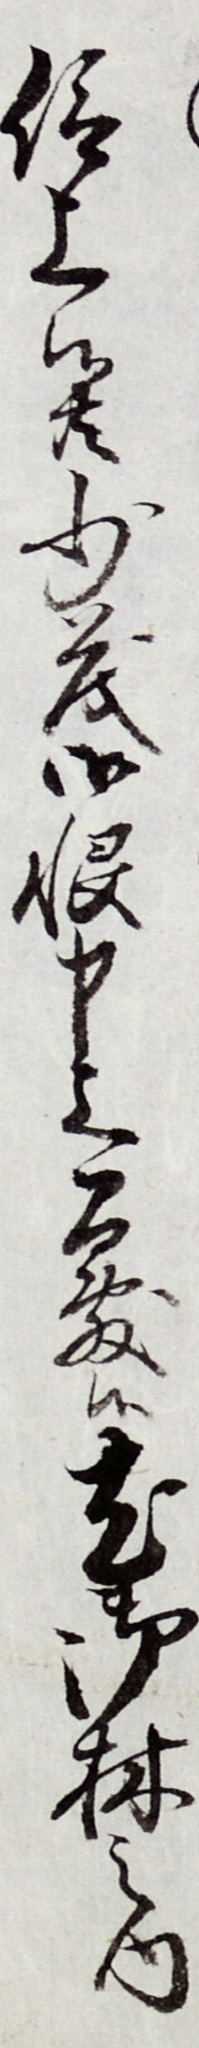仰上候共少も御恨申上間敷候尤御林之内
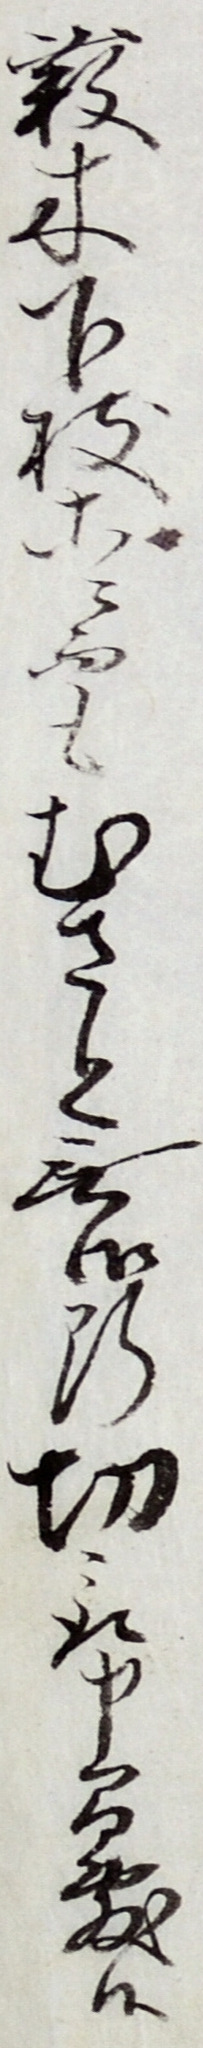薮木下枝等ニ而もむさと無御断切取申間敷候

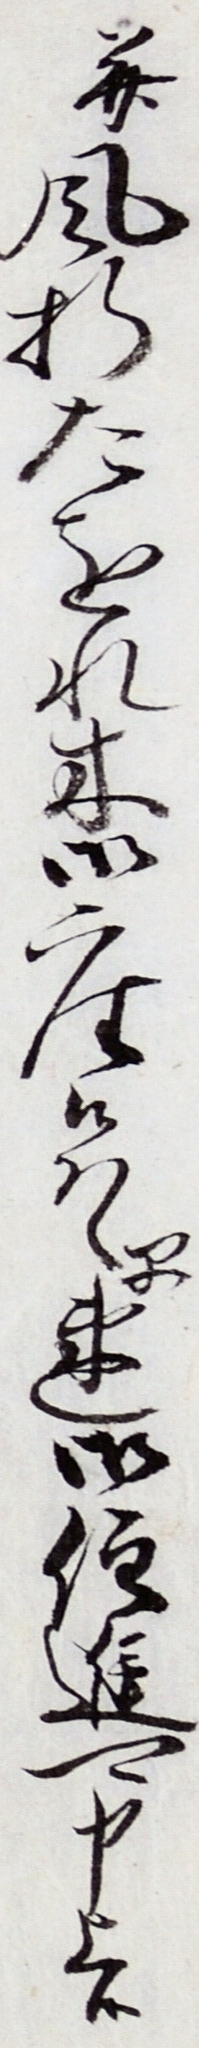并風折たをれ木御座候ハヽ早速御注進可申上候
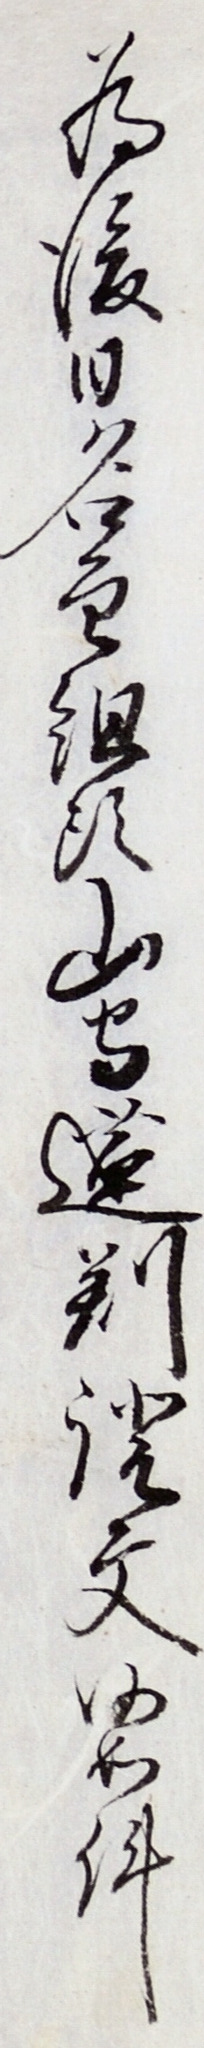為後日名主組頭山守連判証文仍如件
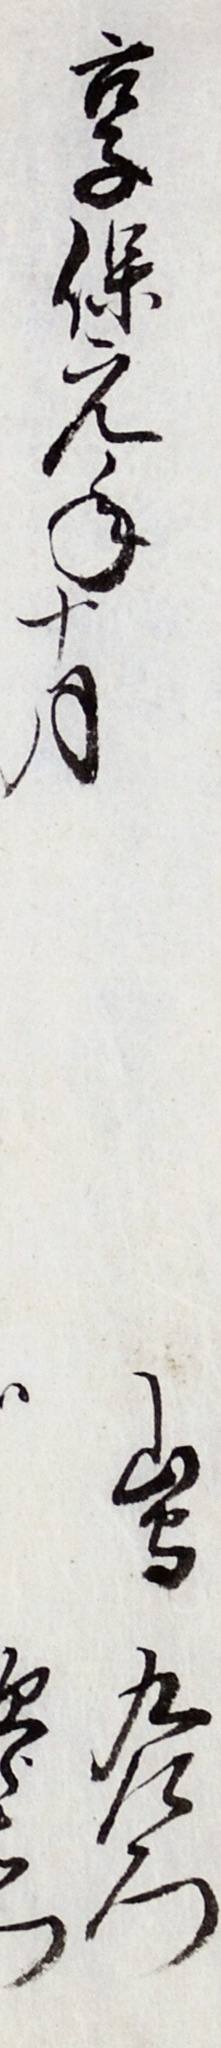享保元年十月山守九左衛門
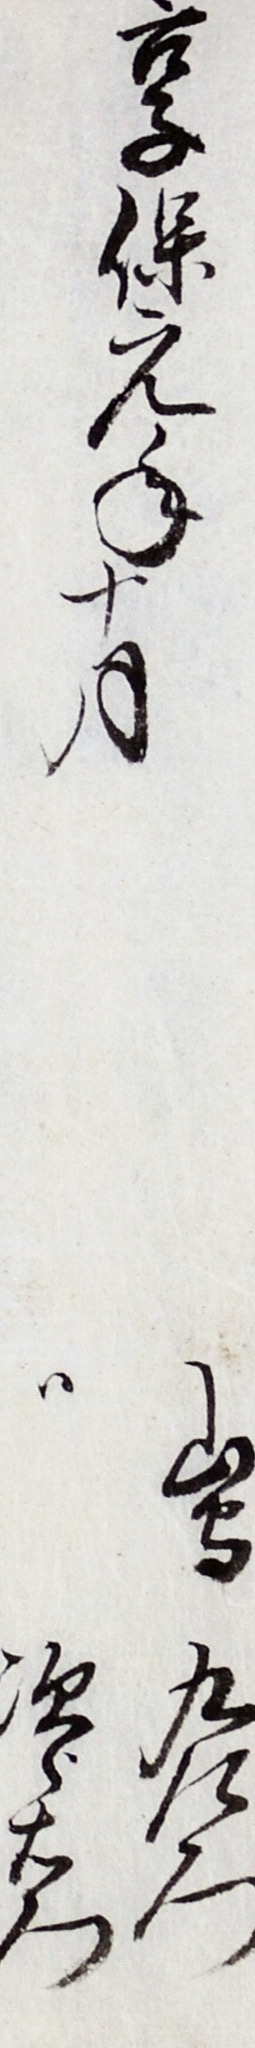享保元年十月山守九左衛門
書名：御林御竹藪証文控
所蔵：伊那市立高遠町図書館・合同会社AMANE
